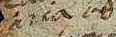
azia em dro
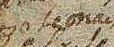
_o se o não
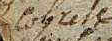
cobrese
